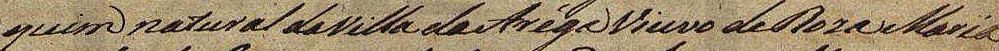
quim natural da villa de Aréga viuvo de Roza Maria,
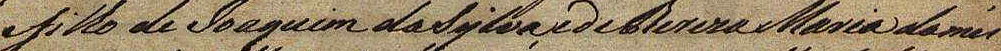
e filho de Ioaquim da Sylva, e de Thereza Maria da mes
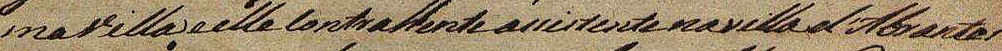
ma villa e elle contrahente e assistente na villa d'Abrantes
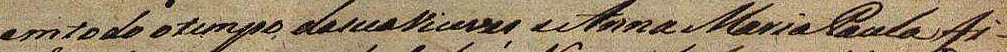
em todo o tempo da sua viuves, e Anna Maria Paula fi
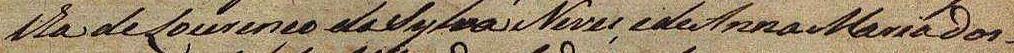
lha de Lourenço da Sylva Neves, e de Anna Maria dos
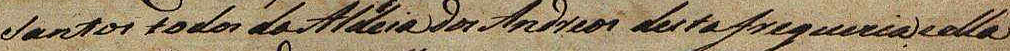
Santos todos da Aldeia de Andreos desta freguezia e ella
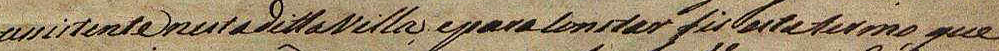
assistente nesta ditta villa, e para constar fis este termo, que
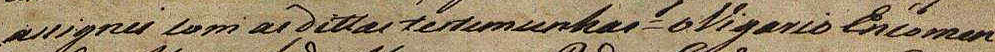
assignei com as dittas testemunhas = o Vigario Encomen
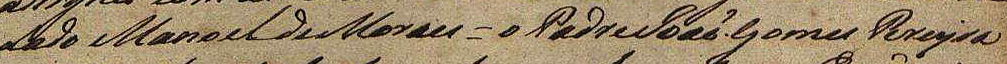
dado Manoel de Moraes = o Padre Ioaõ gomes Pereyra
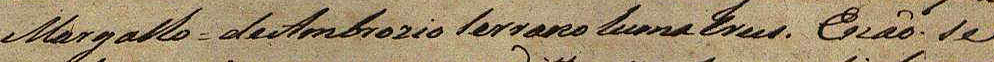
Margalho = de Ambrozio serrano huma crus. E naõ se
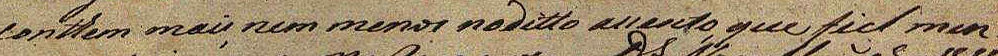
conthem mais, nem menos no ditto assento, que fielmen
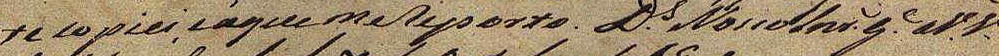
te copiei, e a que me Riporto. D.s Nosso snr̄. g.e a V.V.
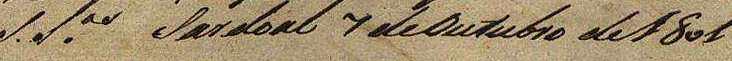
S.S.as Sardoal 7 de Outubro de 1801
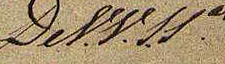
De V.V.S.S.as
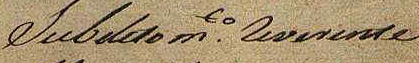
Subdito m.to Reverente
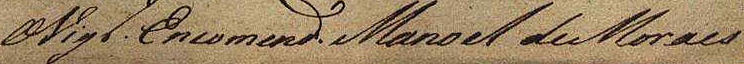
O Vigr.o Encomend.o Manoel de Moraes.
